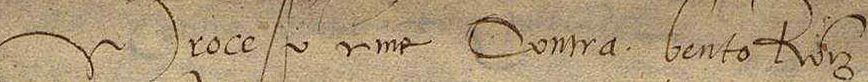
Proceso em Contra bento Roīz
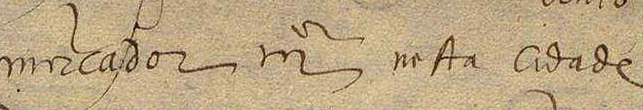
mercador mor nesta cidade
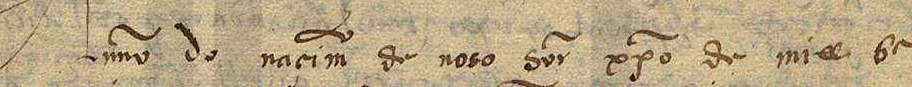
Anno do nacimto de noso so̅r xp̅o de mill bc
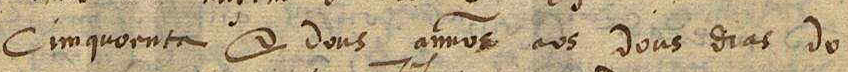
cimquoenta e dous annos aos dous dias do
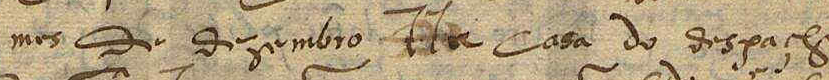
mes de dezembro Na casa do despacho
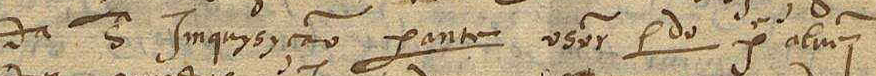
da sta Jmquysição ꝑante o so̅r Ldo pe aluēz
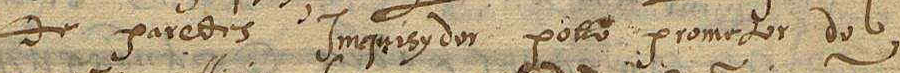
de paredes Jmquisydor pollo prometor do
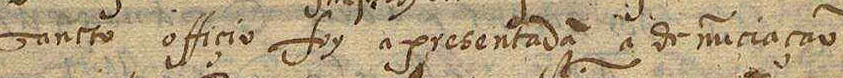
sancto offiçio foy apresentada denūciação
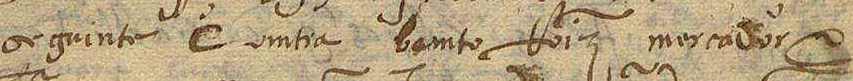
seguinte Comtra bemto Rōiz mercador e
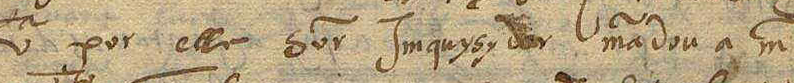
vta por elle so̅r Jmquysydor mādou a mj̄
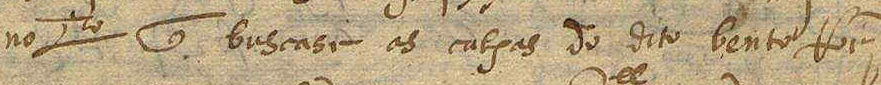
notro q̄ buscase as culpas do dito bento Roīz
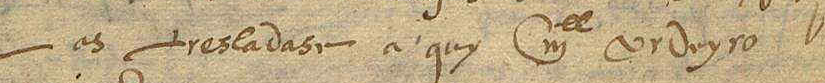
e as tresladase aquy mell cordeyro
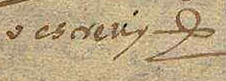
o escreuy
